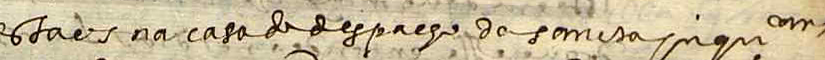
estaos na casa do despacho da samcta jnquçam
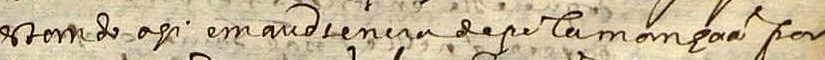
estando ahi em audiencia de pela manhaā por
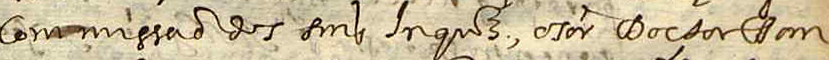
commissaõ dos snrs̄ Inquēs, o sōr Doctor Dom
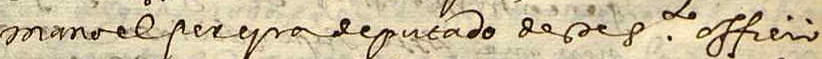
manoel perejra deputado deste st.o officio
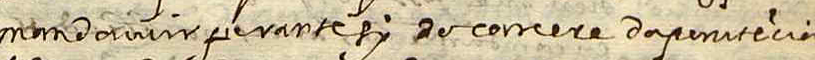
mandou uir perante sy do carcere da penitēcia
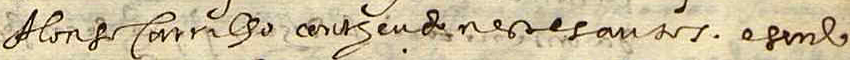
Alonso Carrilho contheudo nestes autos. e sendo
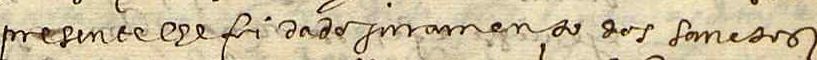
presente lhe foi dado juramento dos sanctos
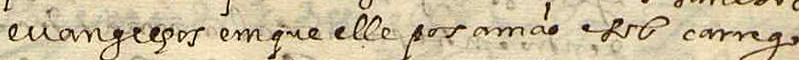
euangelhos em que elle pos a maõ e sob carrego
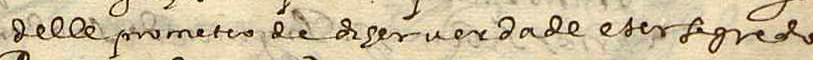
delle prometeo de dizer uerdade e ter segredo
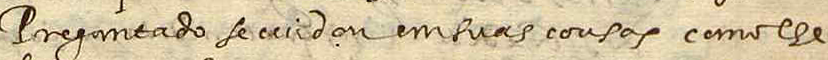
Preguntado se cuidou em suas cousas como lhe
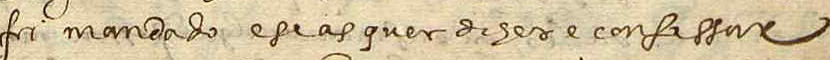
foi mandado e se as quer dizer e confessar
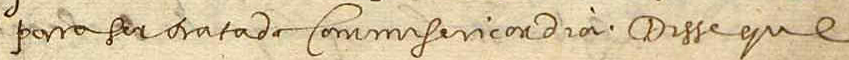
para ser tratado Com misericordia. Disse que
